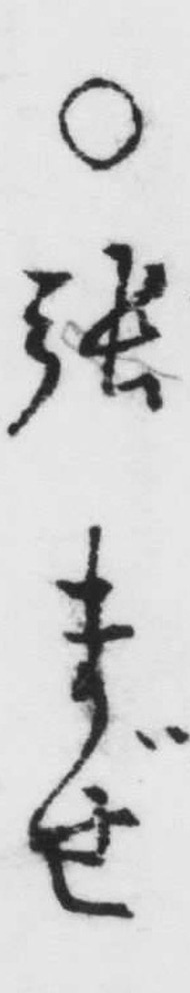○張まぜ

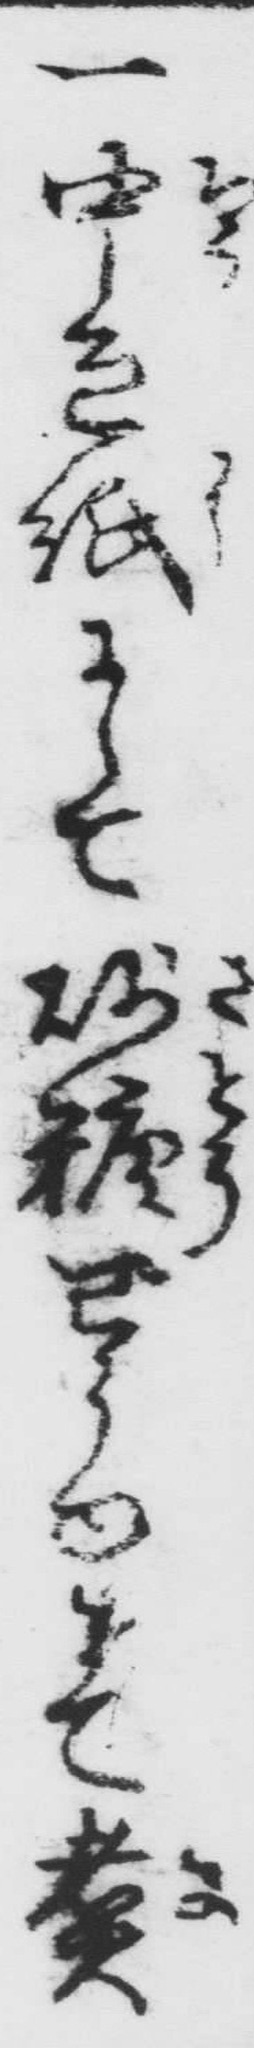一中色紙にして砂糖ぜうゆにて煮
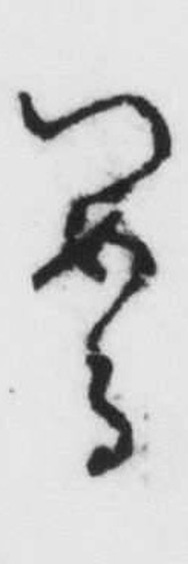つめる
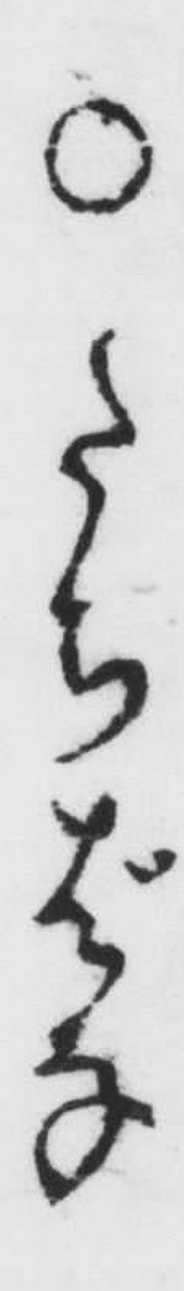○たちばな
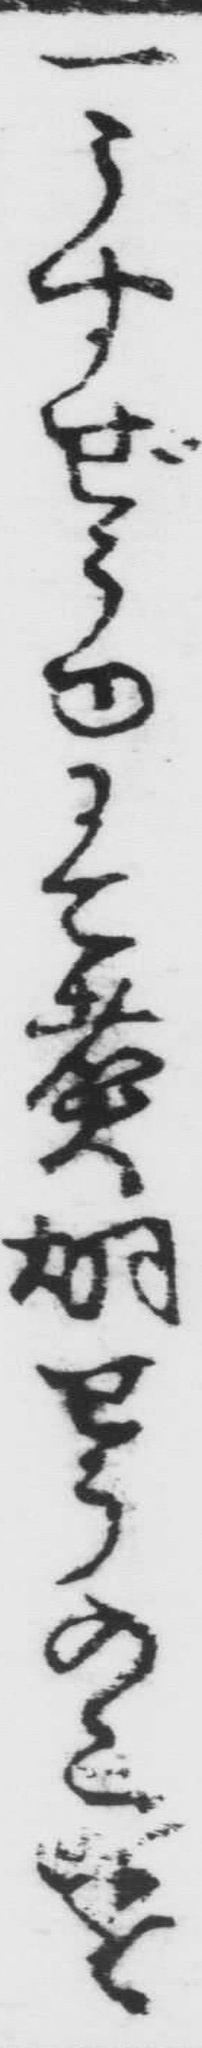一うすぜうゆにて煮胡せうのこを
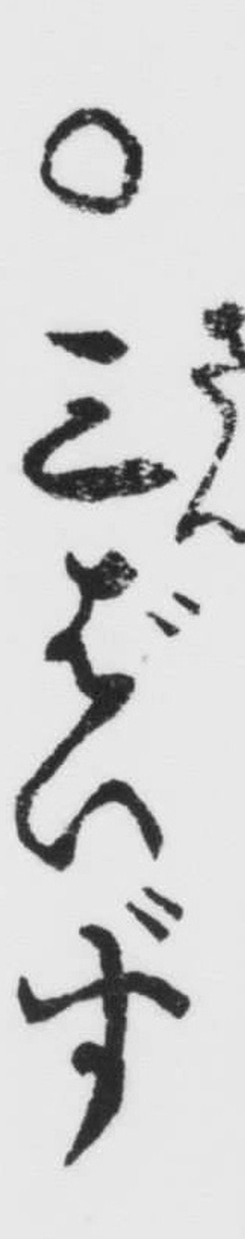○三ばいず
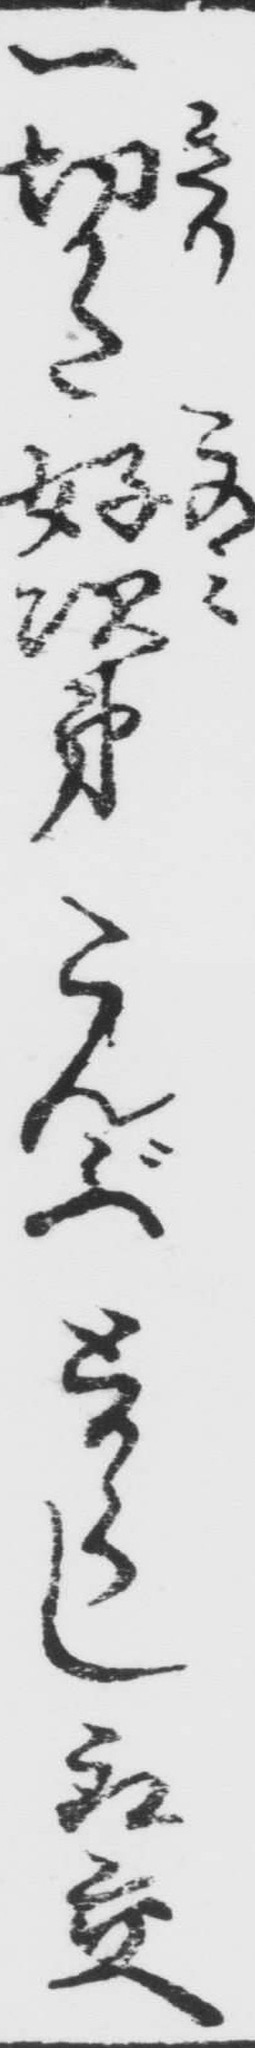一切かた好次第こんぶとからし取交
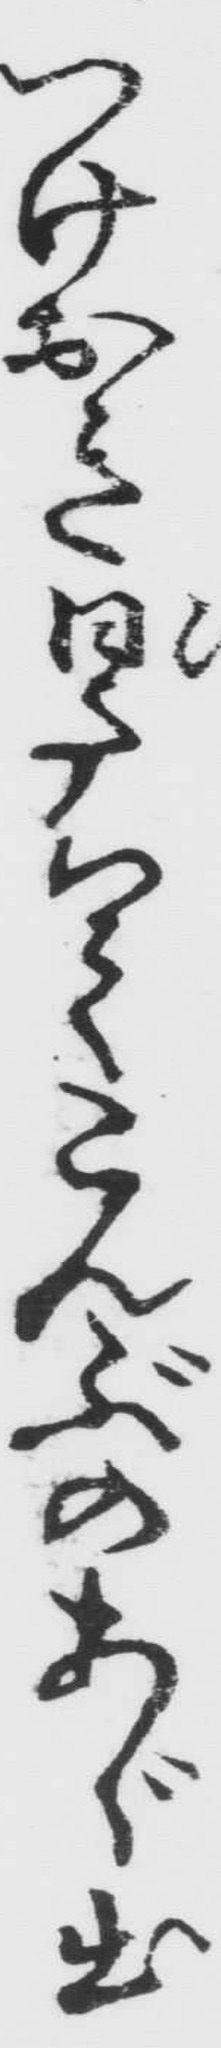つけおき日たちてこんぶのあじ出
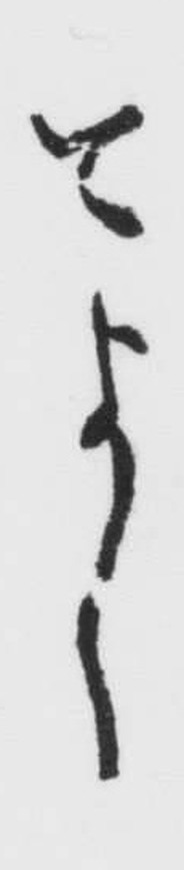てよし
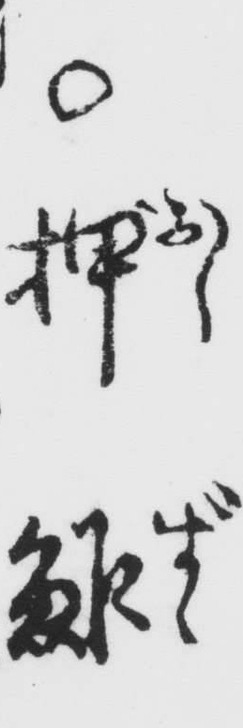○押鮓
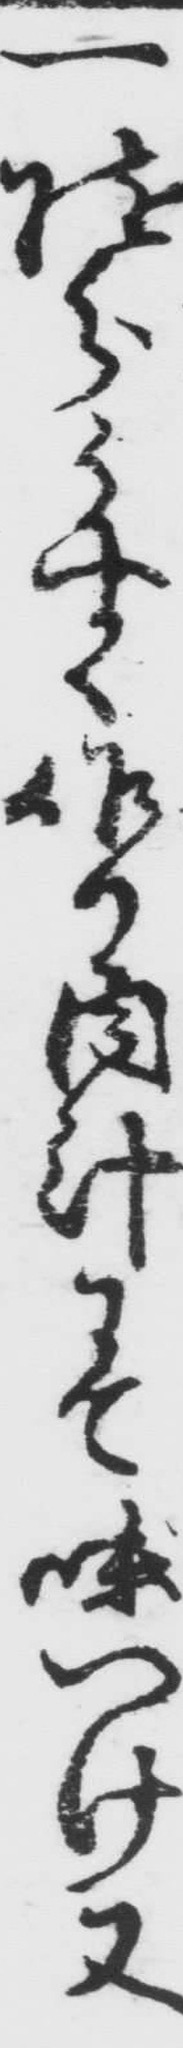一随分うすく作り肉汁にて味つけ又

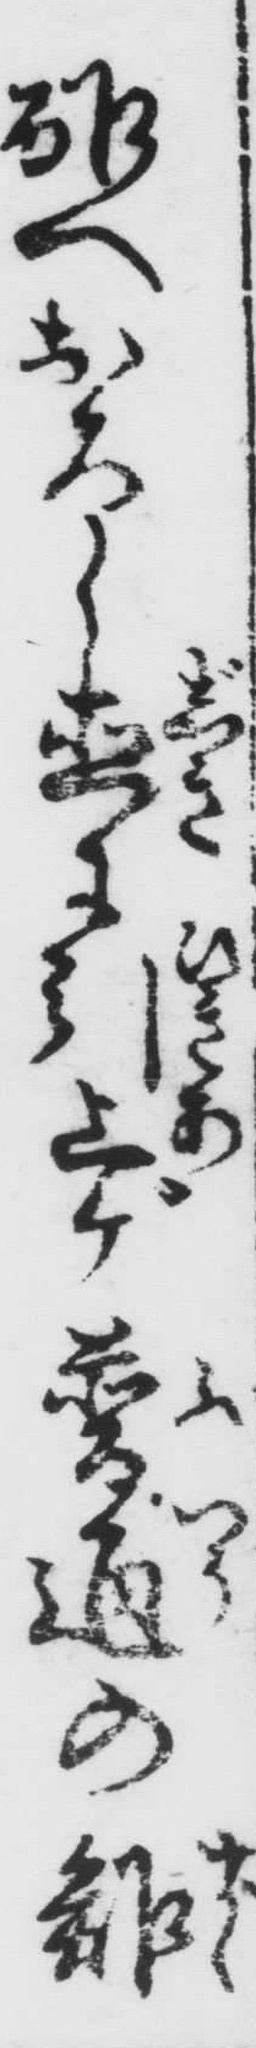酢へおろし直に引上げ普通の鮓
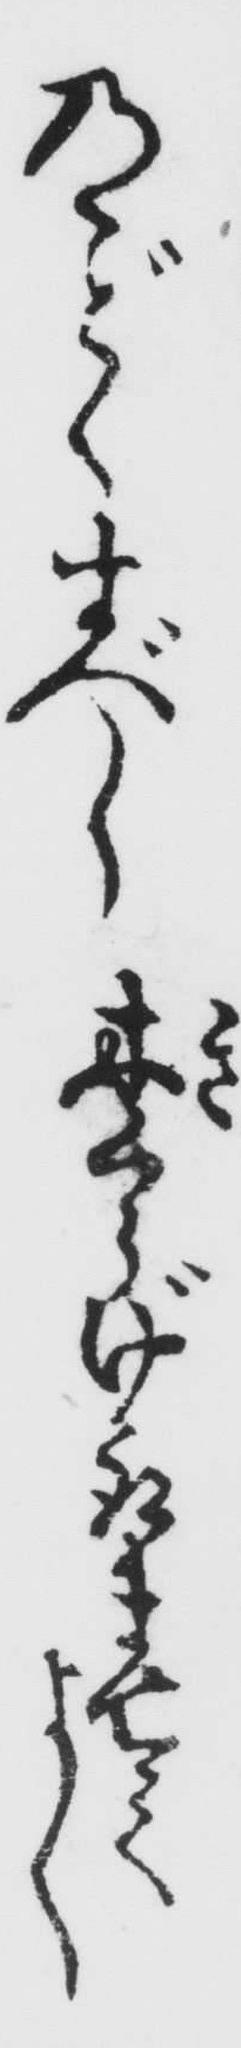のごとくすべし木くらげ取まぜて
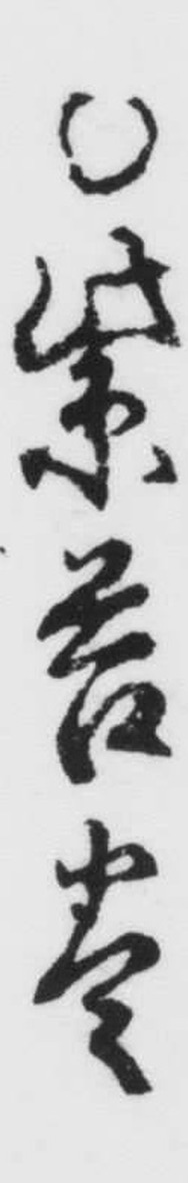○紫苔巻
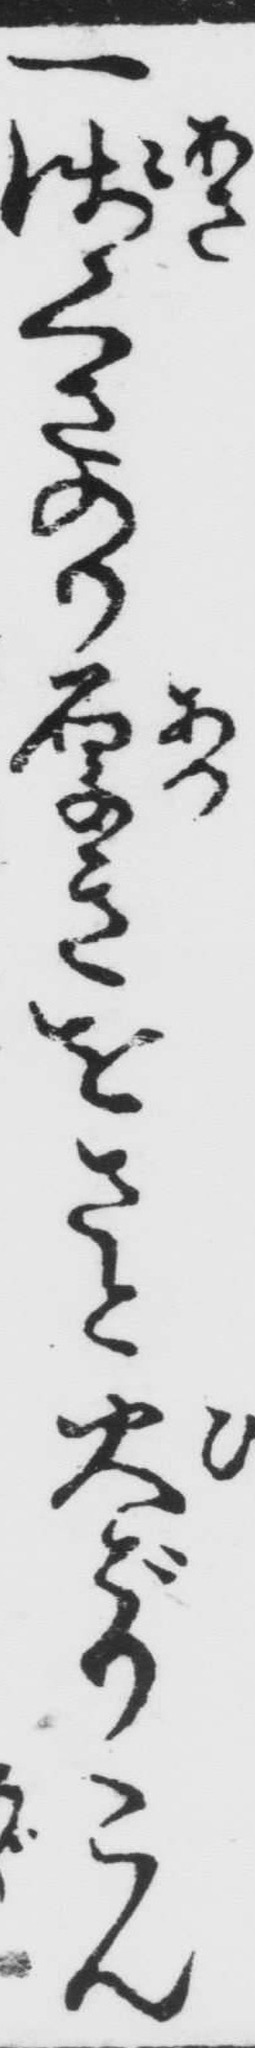一浅くさのり厚きをさと火どりこん
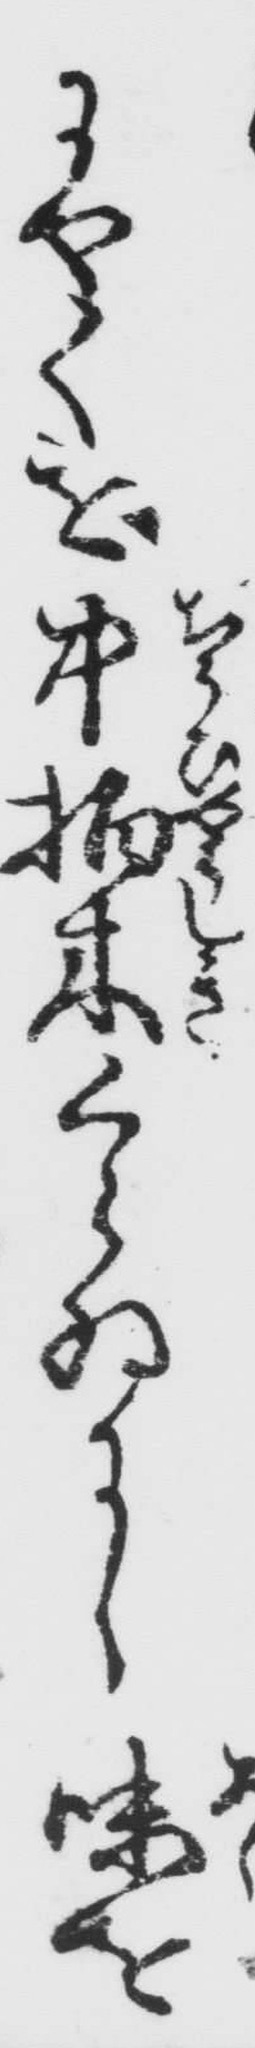にやくを中拍木くらゐにし味を
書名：蒟蒻百珍
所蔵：大阪府立大学学術情報センター 国文学研究資料館
